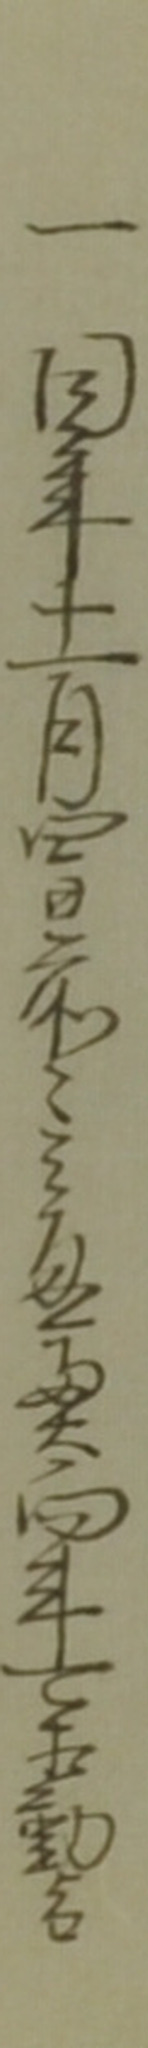一同年十一月四日前々之通奧向斗可相勤旨
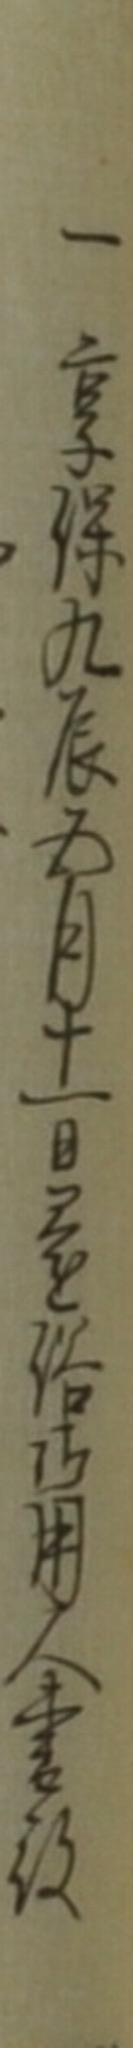一享保九辰五月十一日還俗御用人書役
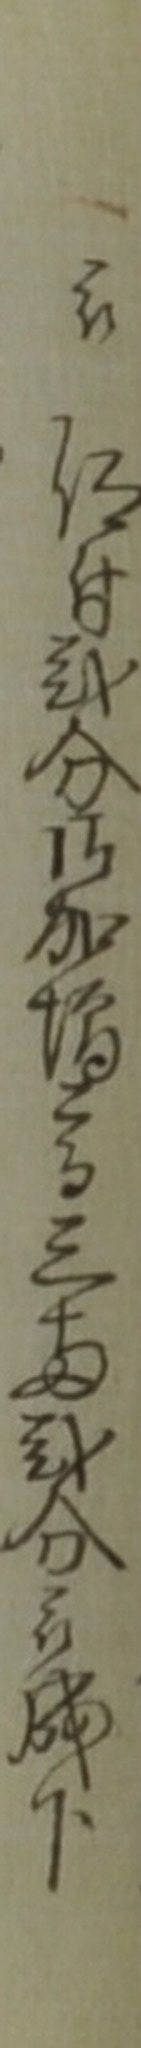被仰付弐分御加増高三両弐分被成下
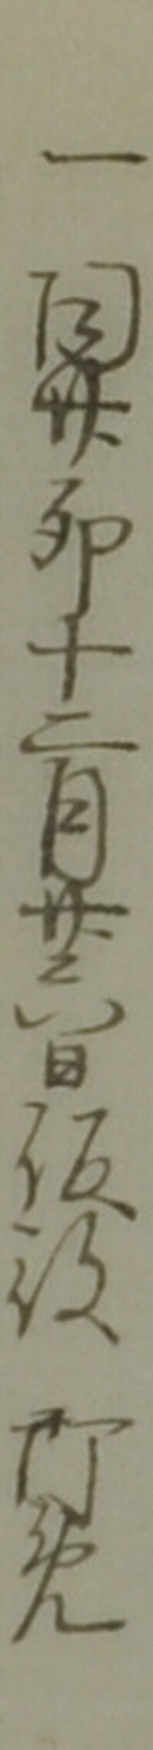一同廿卯十二月廿六日仮役御免
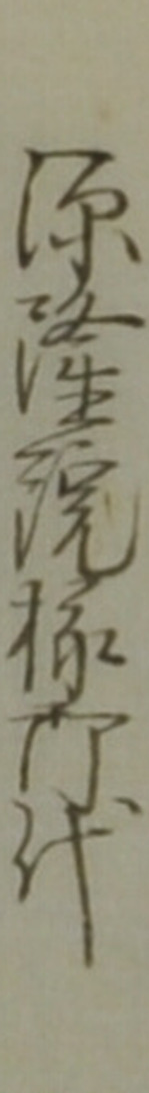源隆院様御代
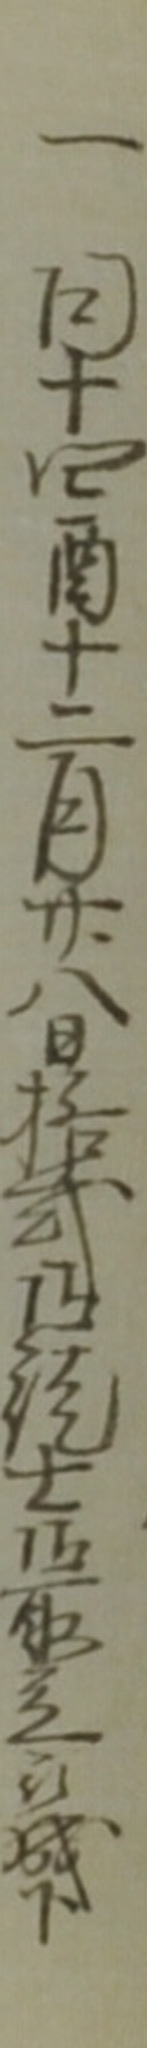一同十四酉十二月廿八日格式御徒士御取立被成下
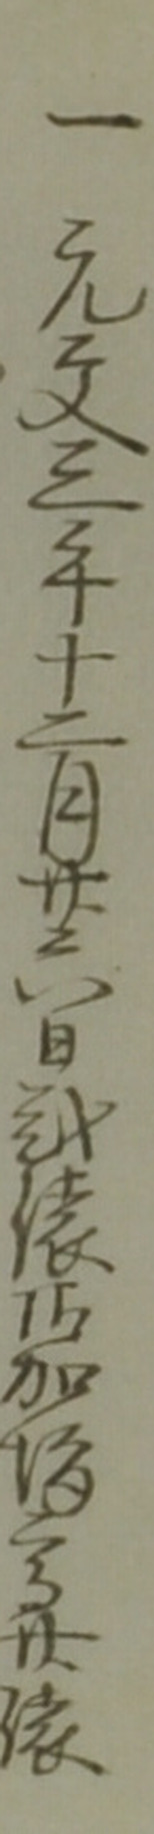一元文三午十二月廿六日弐俵御加増高廿俵
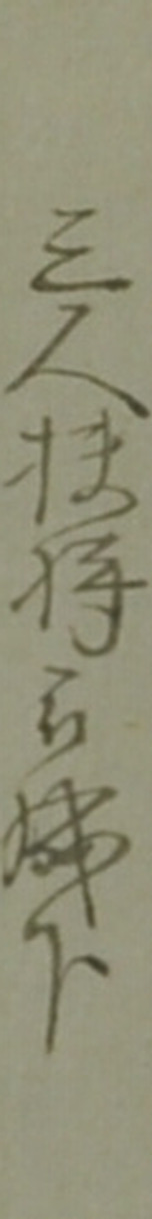三人扶持被成下
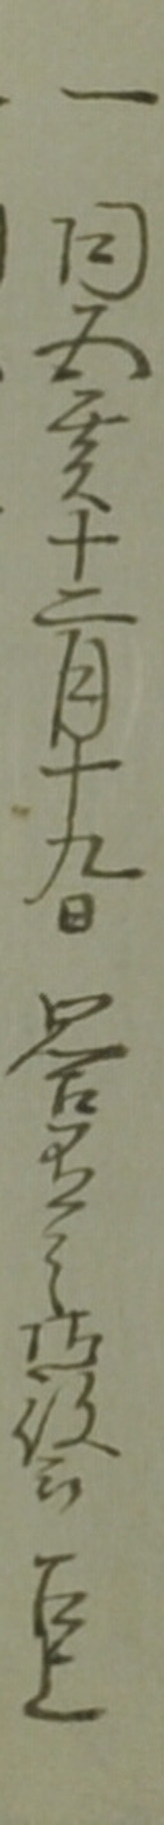一同五亥十二月十九日思召有之御役被召上
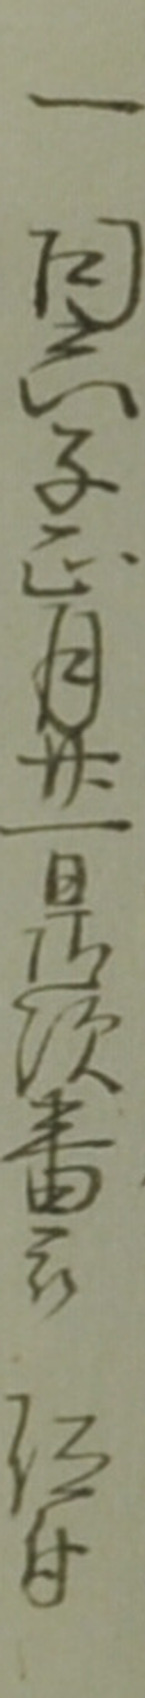一同六子正月廿一日御次番被仰付
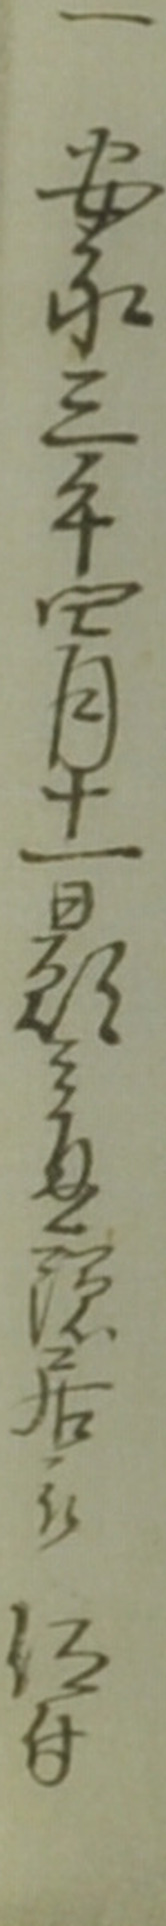一安永三午四月十一日願之通隠居被仰付

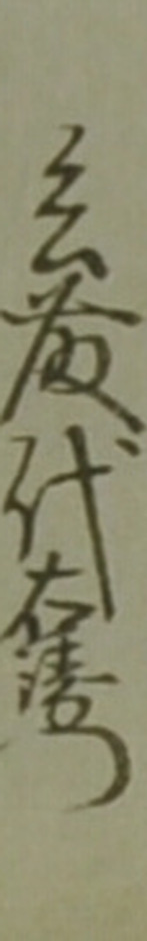兵藤代右衛門
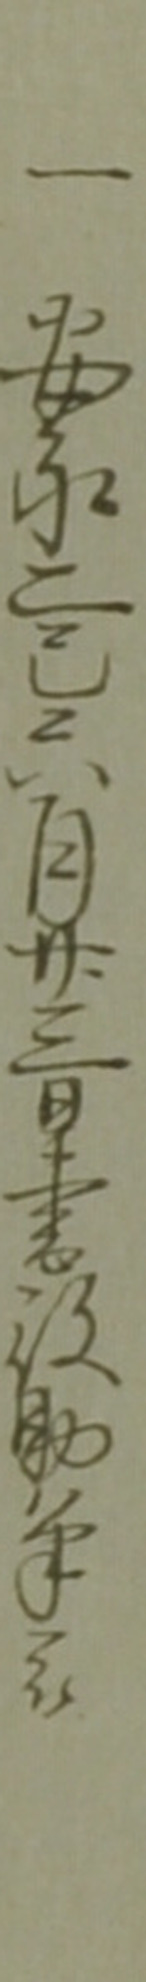一安永二巳六月廿三日書役助筆被
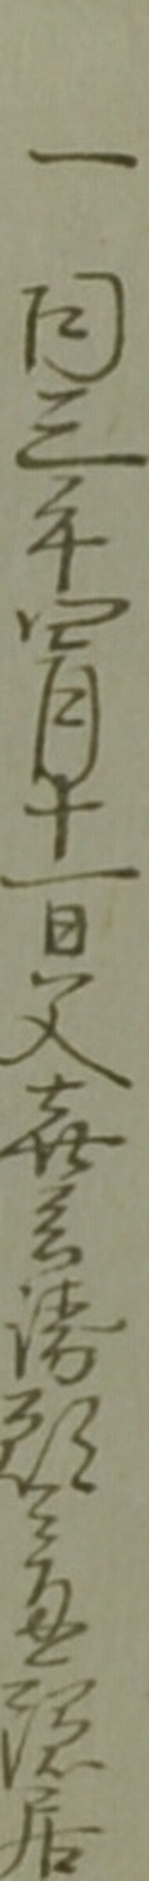一同三午四月十一日父喜兵衛願之通隠居被
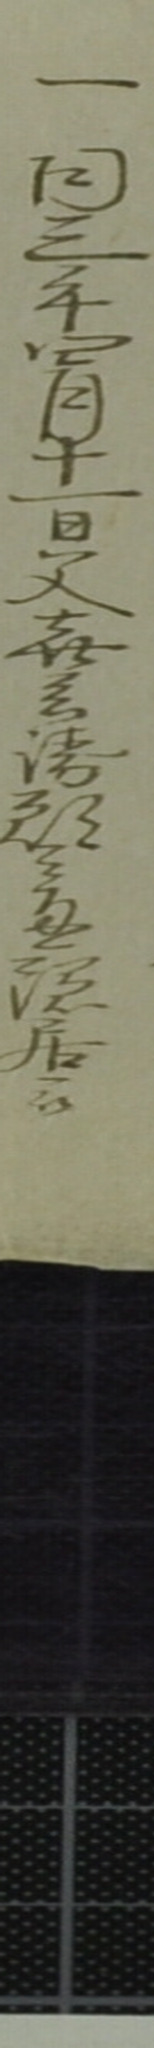一同三午四月十一日父喜兵衛願之通隠居被
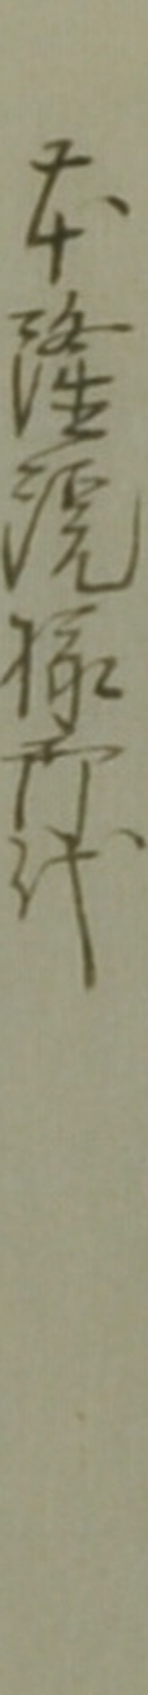本隆院様御代
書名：無足諸士勤仕録（九）
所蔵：伊那市立高遠町図書館・合同会社AMANE
